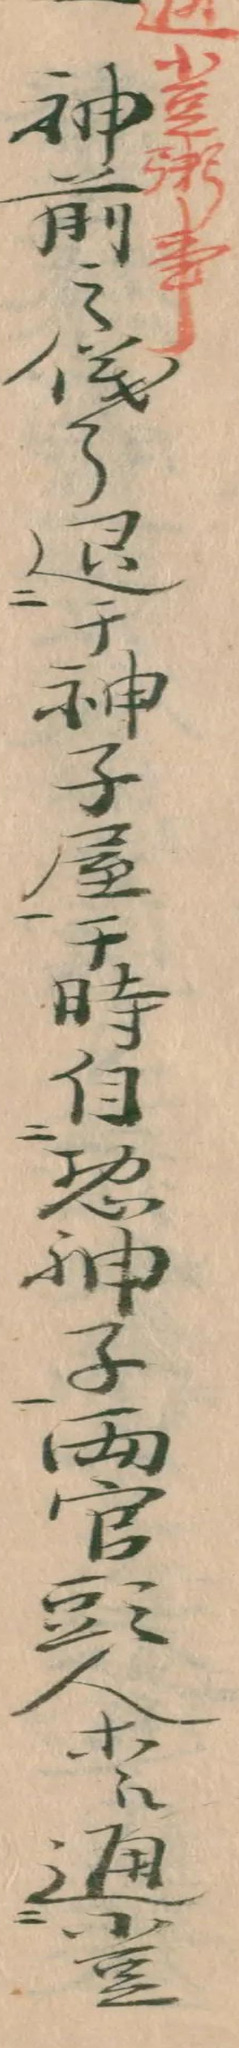一神前之儀了退于神子屋于時自惣神子両官頭人等え通小豆
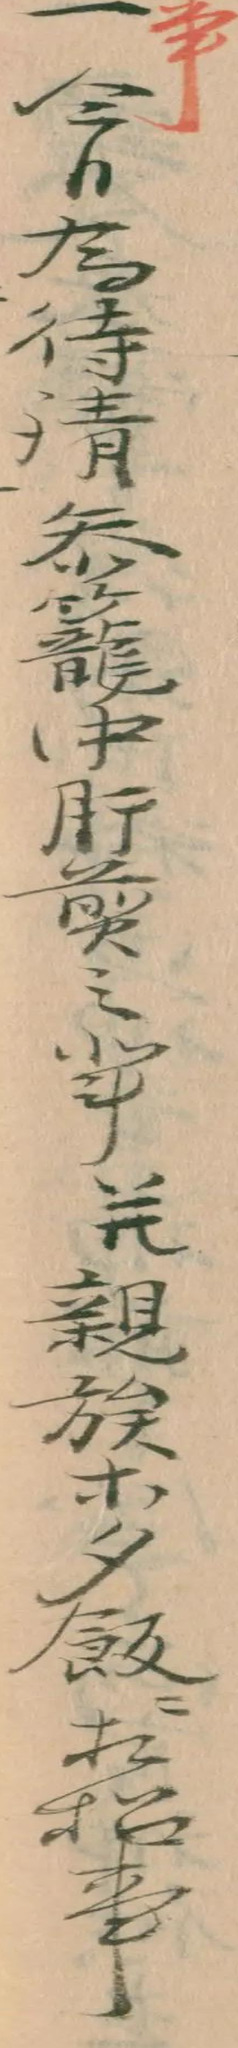一今日為待請参籠中肝煎之輩并親族等夕飯ニ相招事
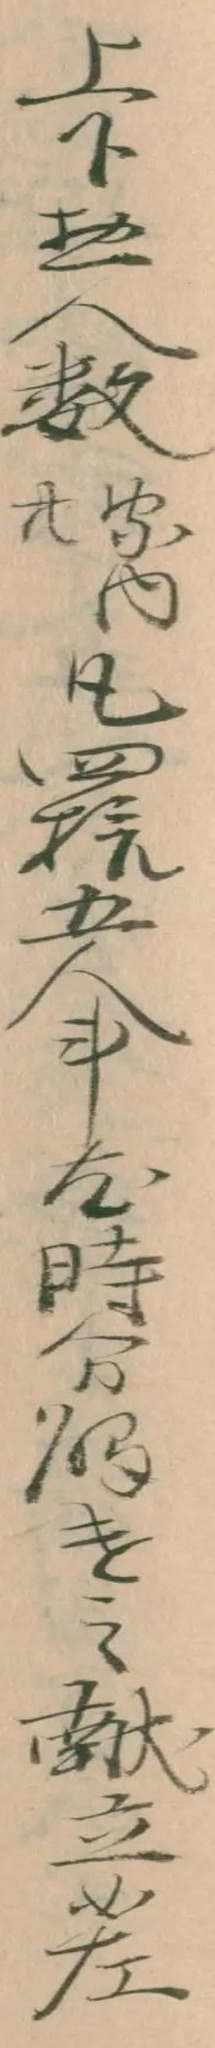上下惣人数家内共凡四拾五人斗尤時分觸遣之献立如左
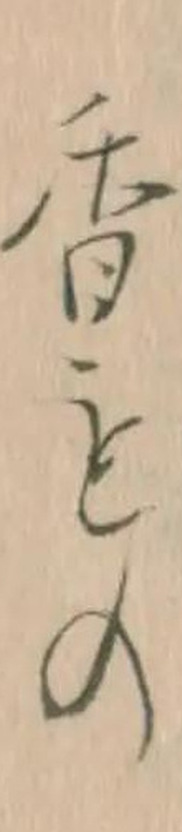香もの

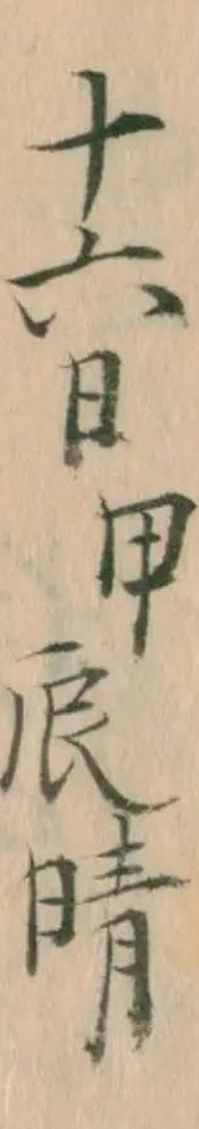十六日甲辰晴
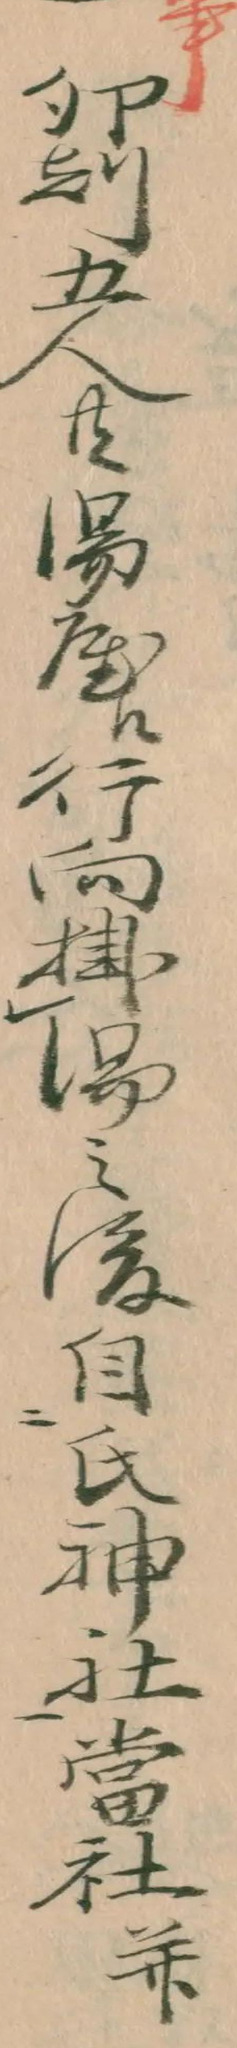一卯刻五人共湯屋え行向掛湯之後自氏神社当當社并
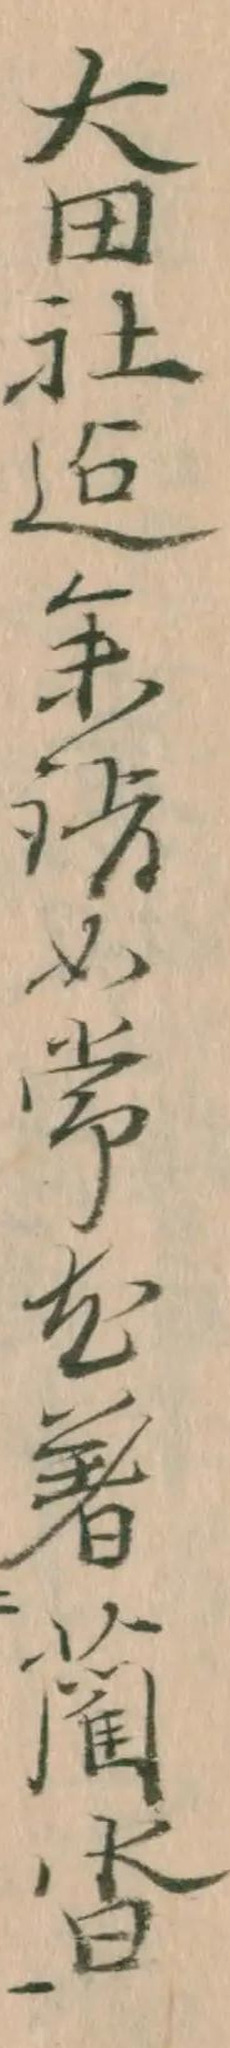大田社迄参詣如常尤着藺沓
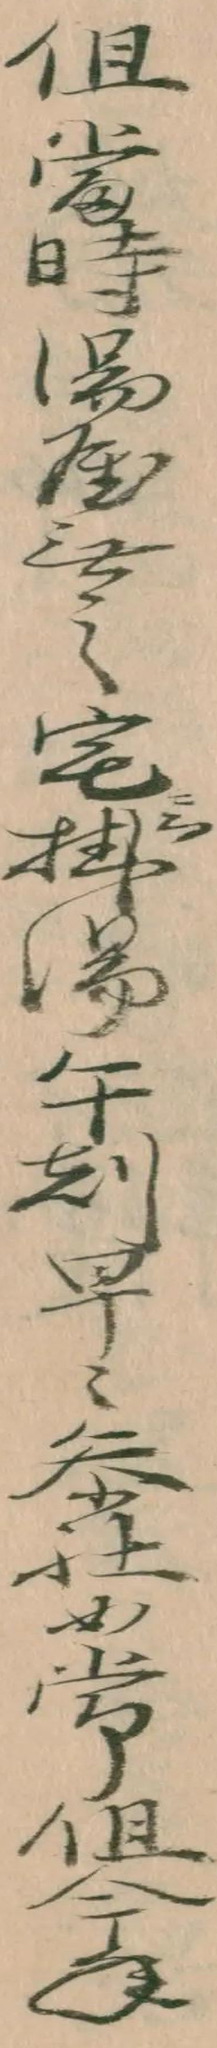但當時湯屋無之宅ニ而掛湯午刻早〻参社如常但今年
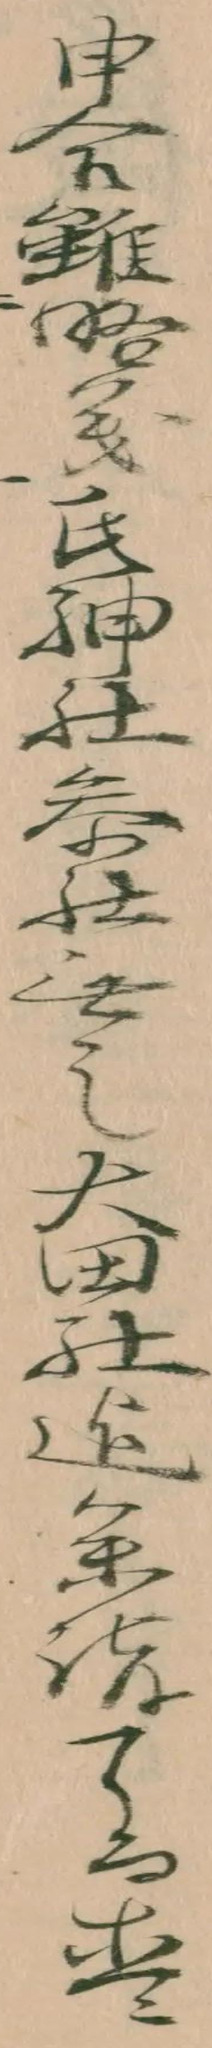申合難略義氏神社参社無之大田社迄参詣了而直ニ
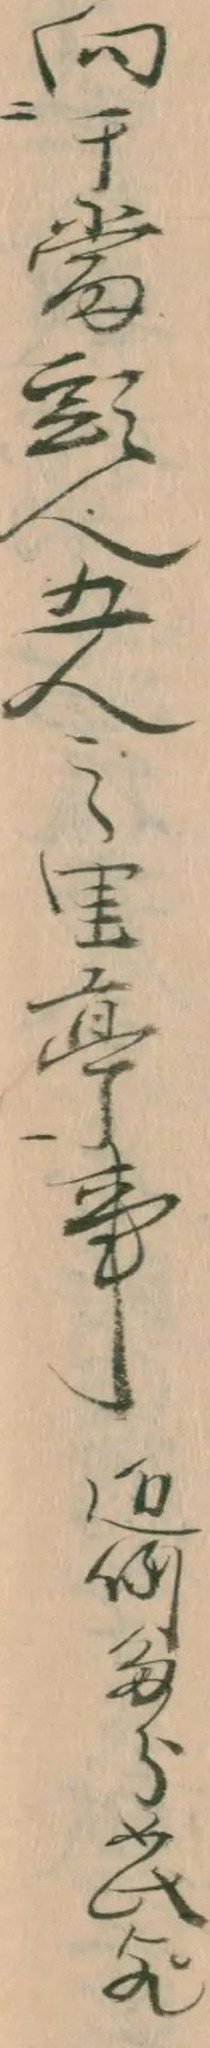向于當頭人五人之里亭事近例多分如此歟
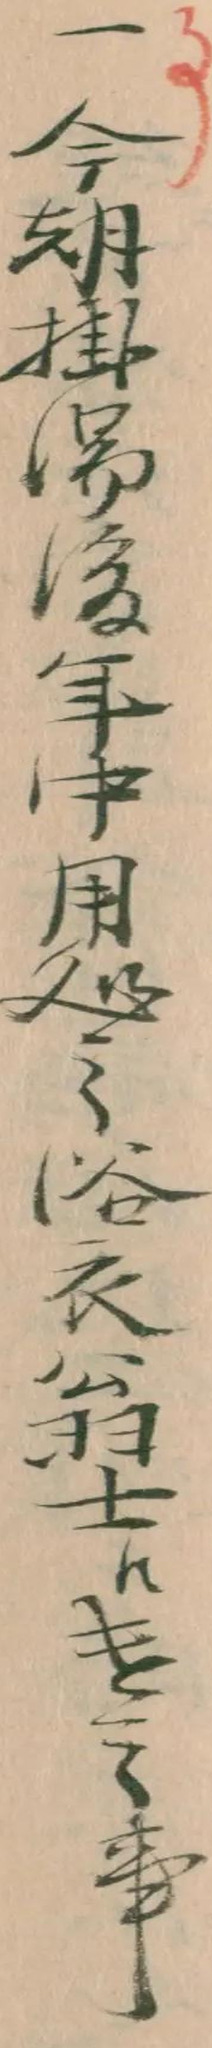一今朝掛湯後年中用処之浴衣翁士え遣之事
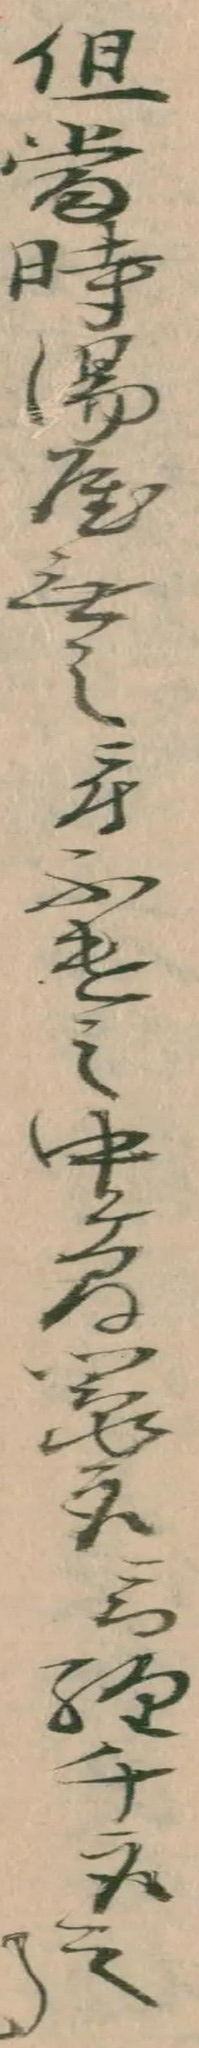但當時湯屋無之ニ付不遣之中ケ間鬮取ニ而経千取之了
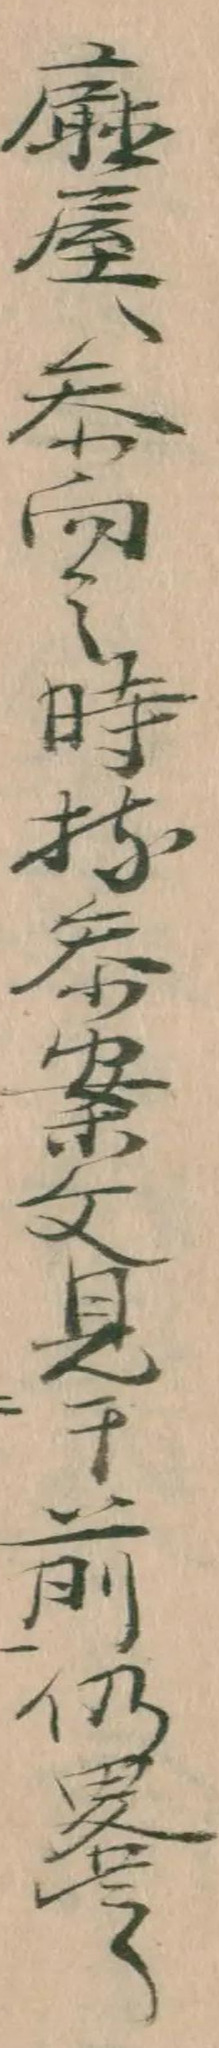廰屋へ参向之時持参案文見于前仍畧之
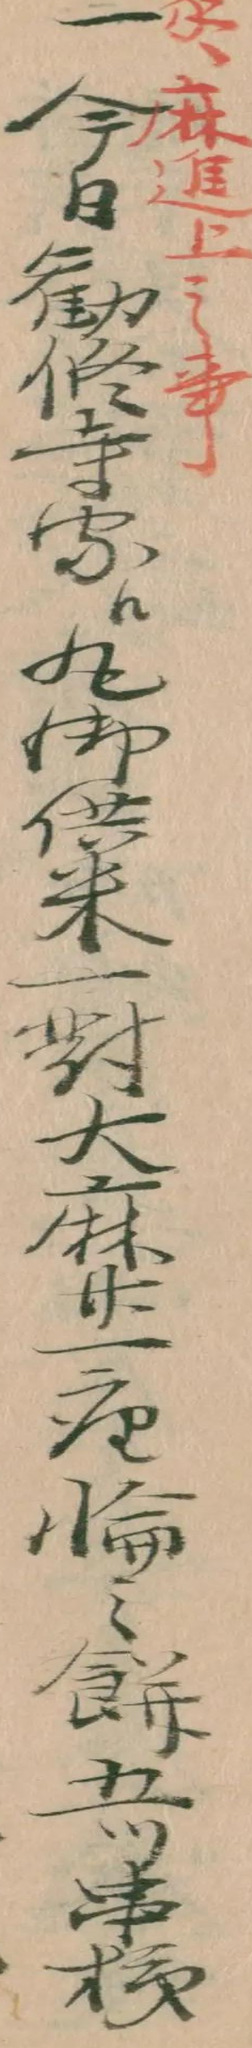一今日勧修寺家え丸御供米一對大麻廿一座輪之飾五ツ串柿
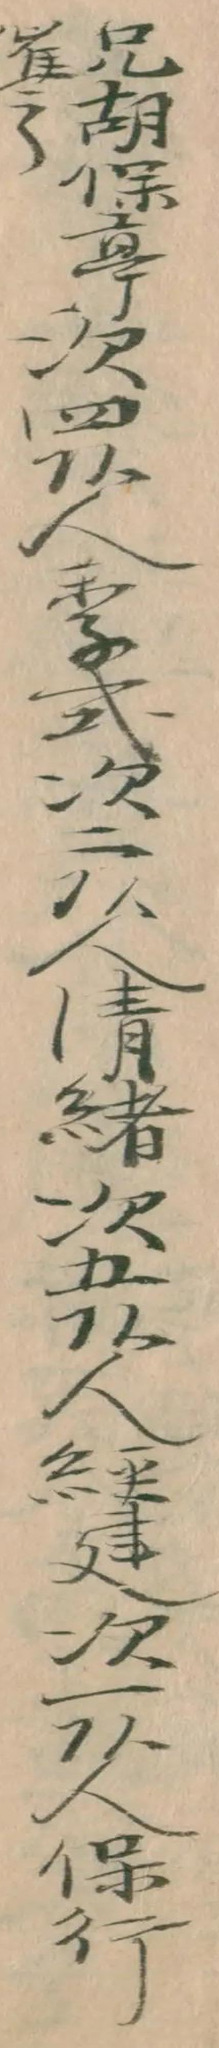兄胡保亭催之次四頭人季式次二頭人清緒次五頭人経建次一頭人保行

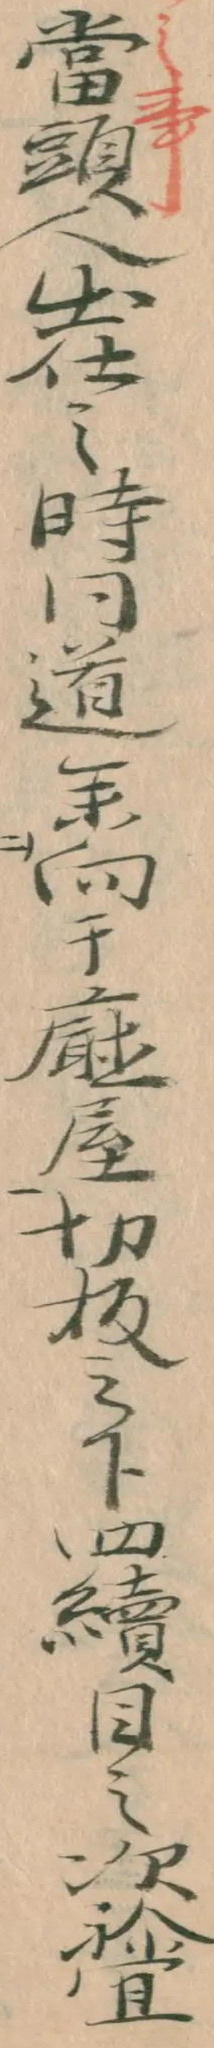當頭人出仕之時同道参向于廰屋切板之下四續目之次祢宜
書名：賀茂社記録. 第74冊
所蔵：国立国会図書館 National Diet Library, JAPAN
